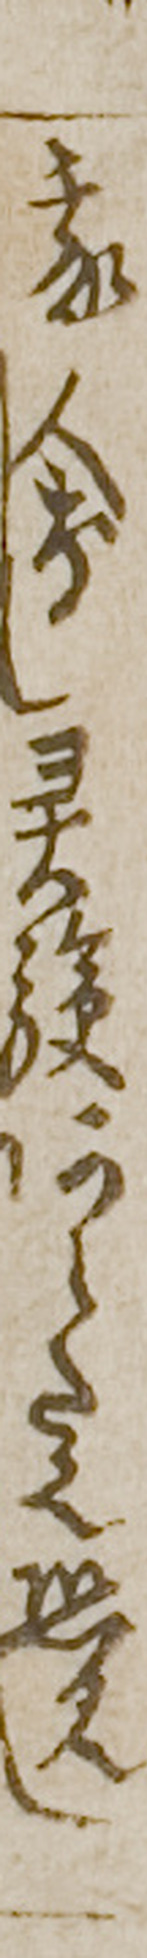我人なし霊験あらた也恐るへし
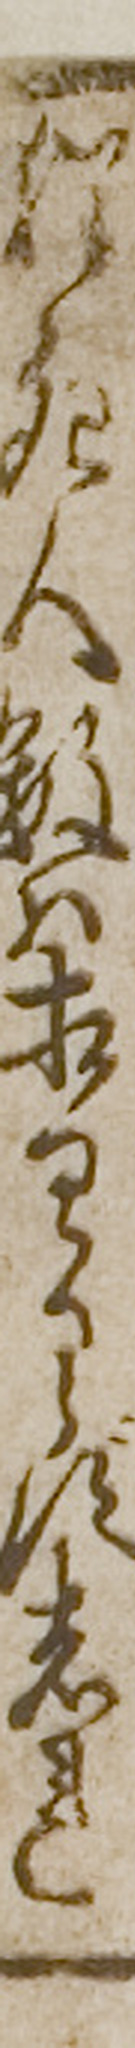猶死人数は相わからずしれ
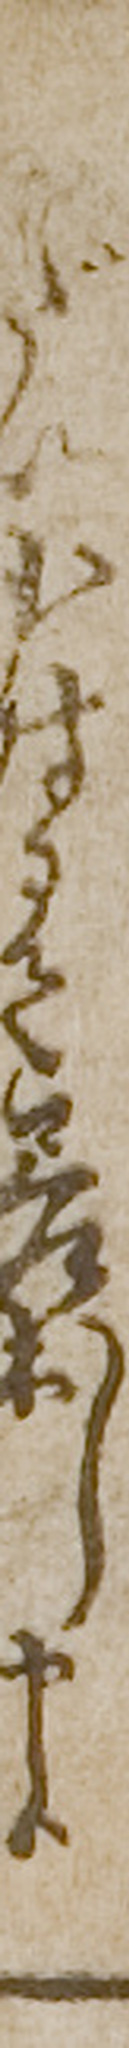しだい小付にて差出し申候
